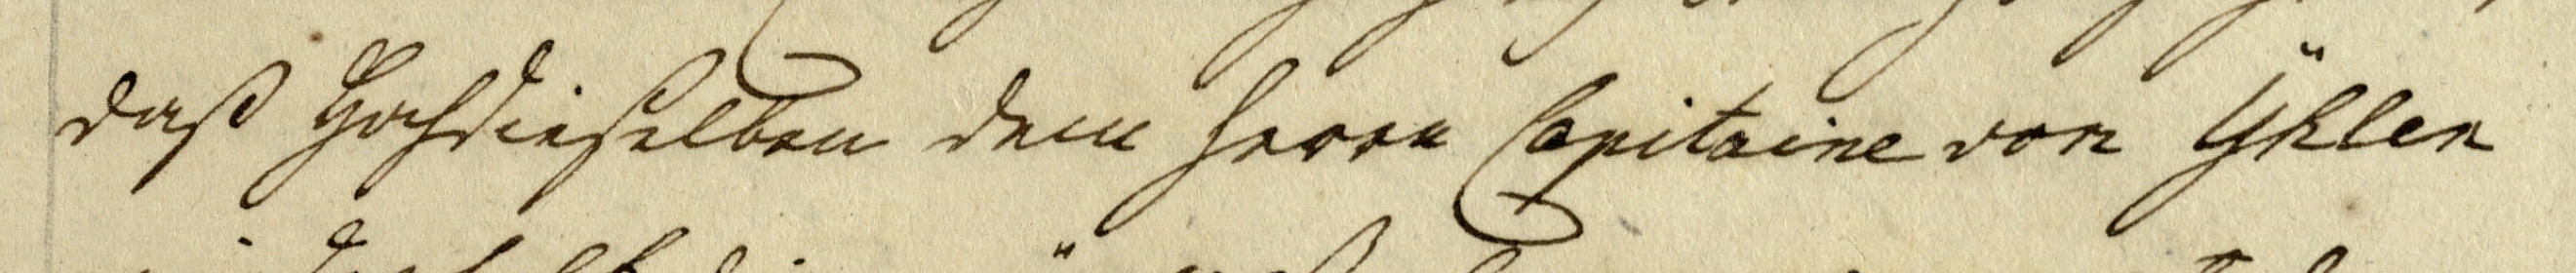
daß Hochdieselben dem Herrn Capitaine von Ÿhlen
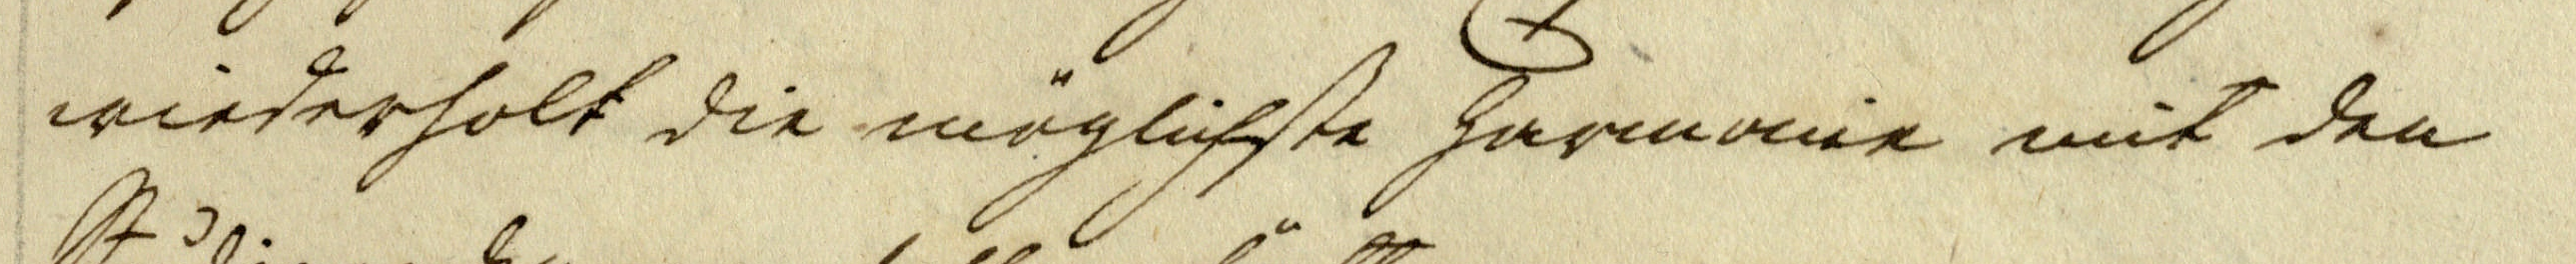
wiederholt die möglichste Harmonie mit den
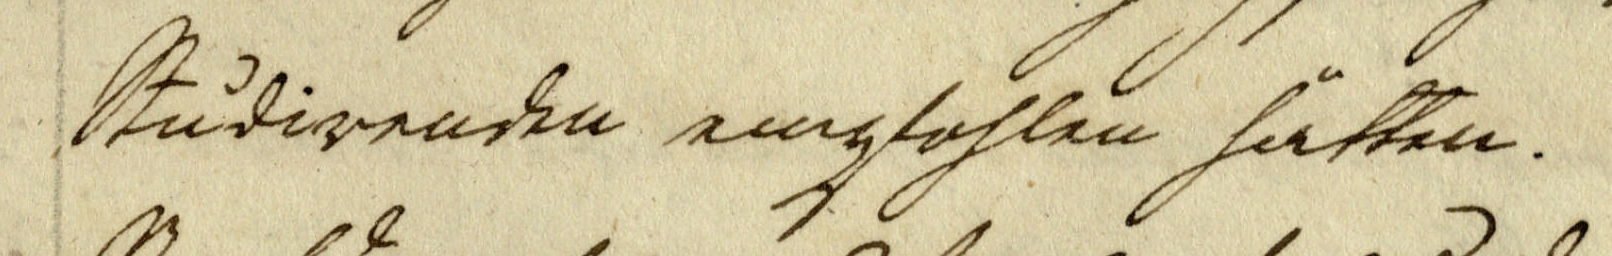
Studirenden empfohlen hätten.
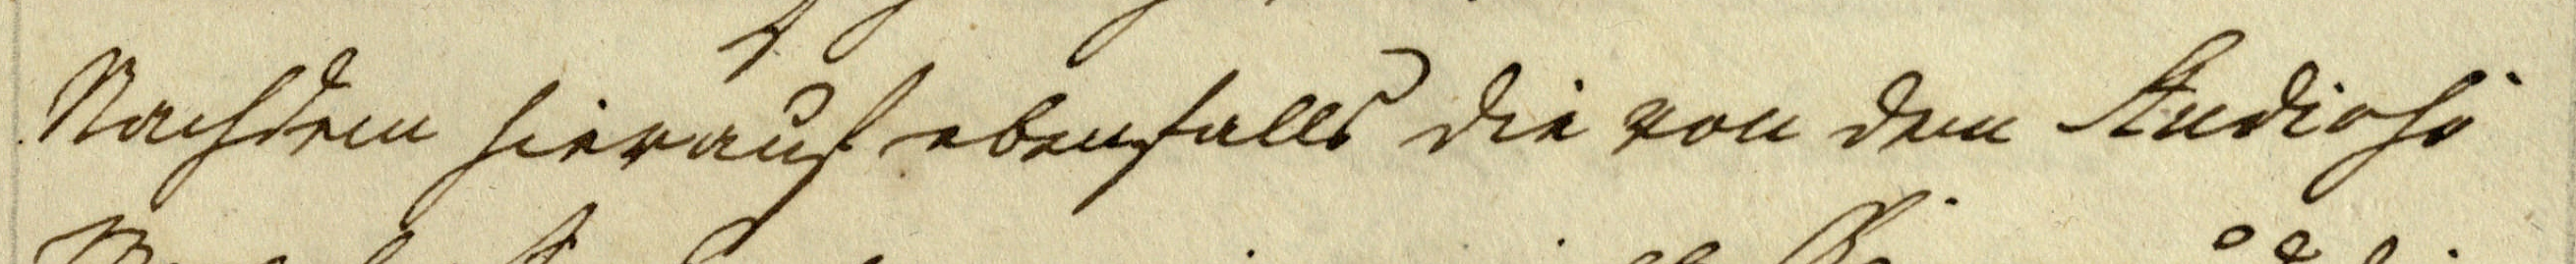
Nachdem hierauf ebenfalls die von dem Studioso
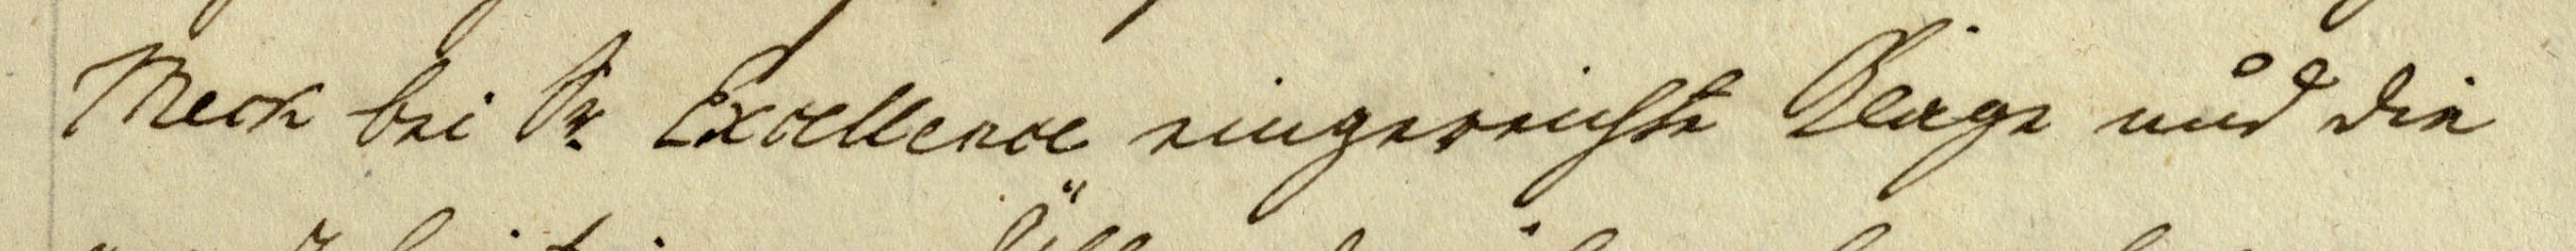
Meck bei Sr Excellence eingereichte Klage und die
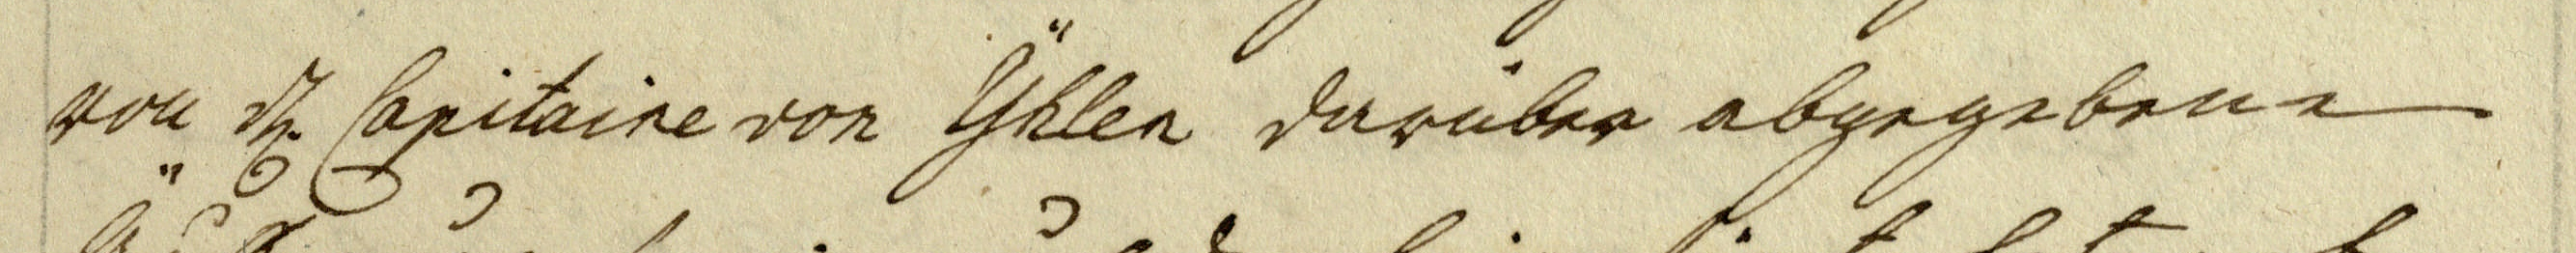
von dh. Capitaine von Ÿhlen darüber abgegebene
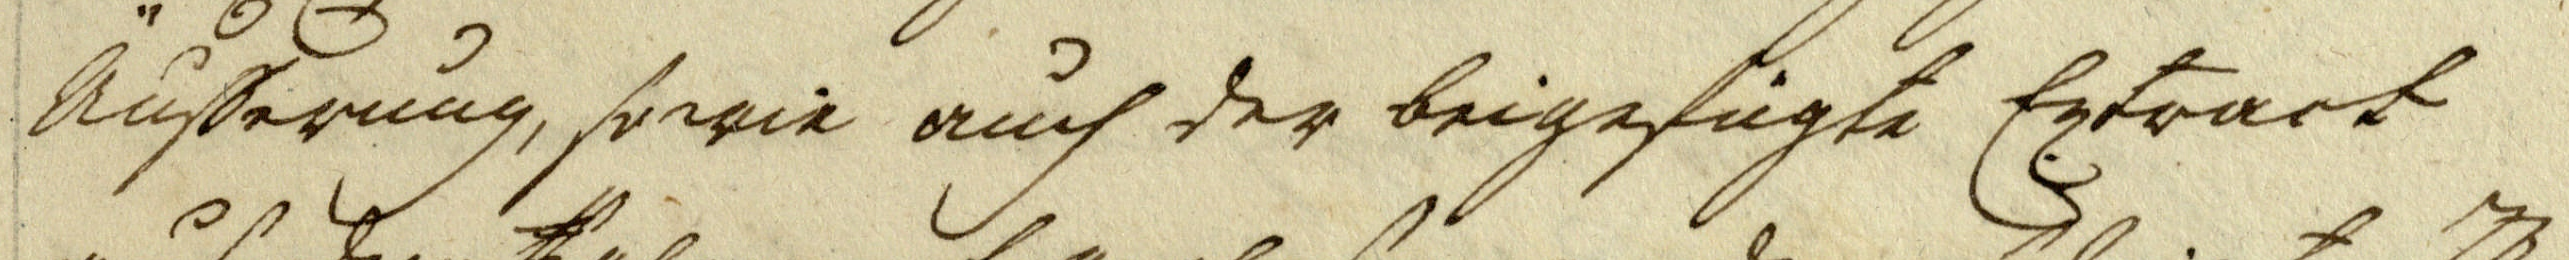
Äusserung, so wie auch der beigefügte Extract
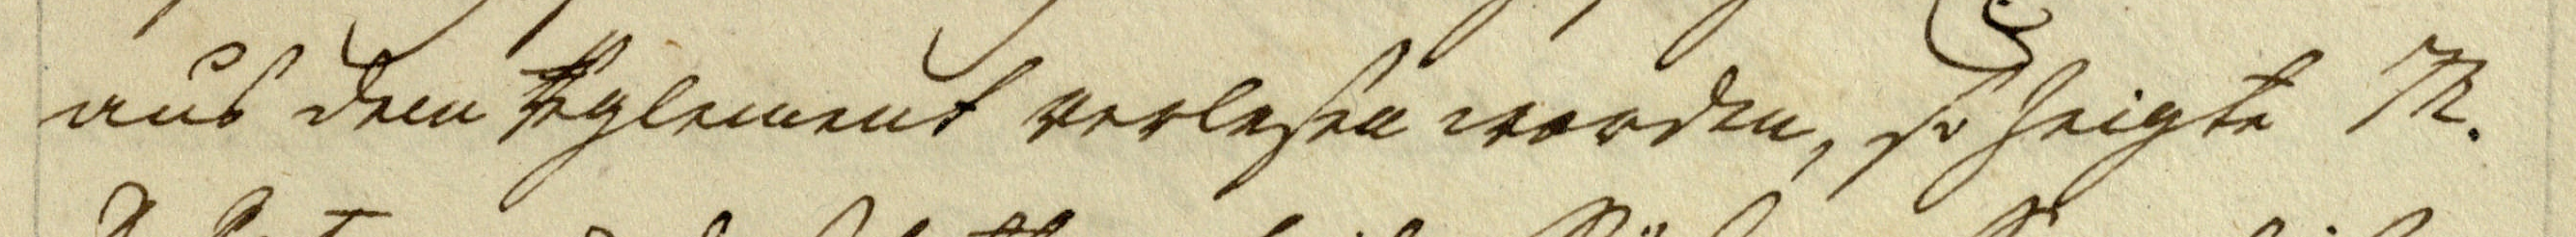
aus dem Reglement verlesen worden, so zeigte M.
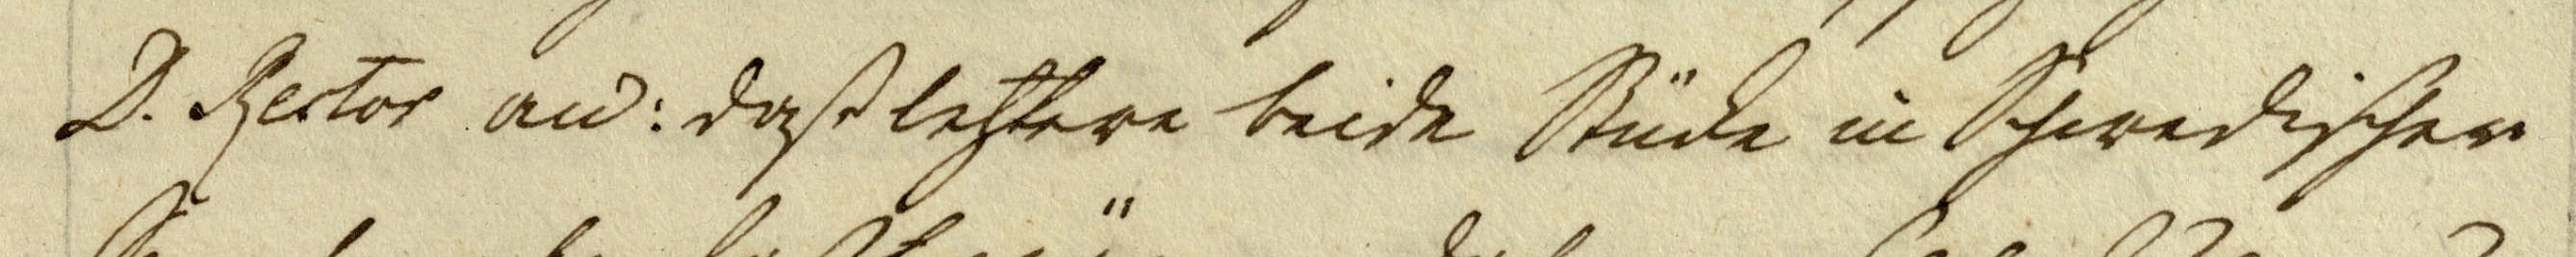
D. Rector an: daß letztere beide Stücke in Schwedischer
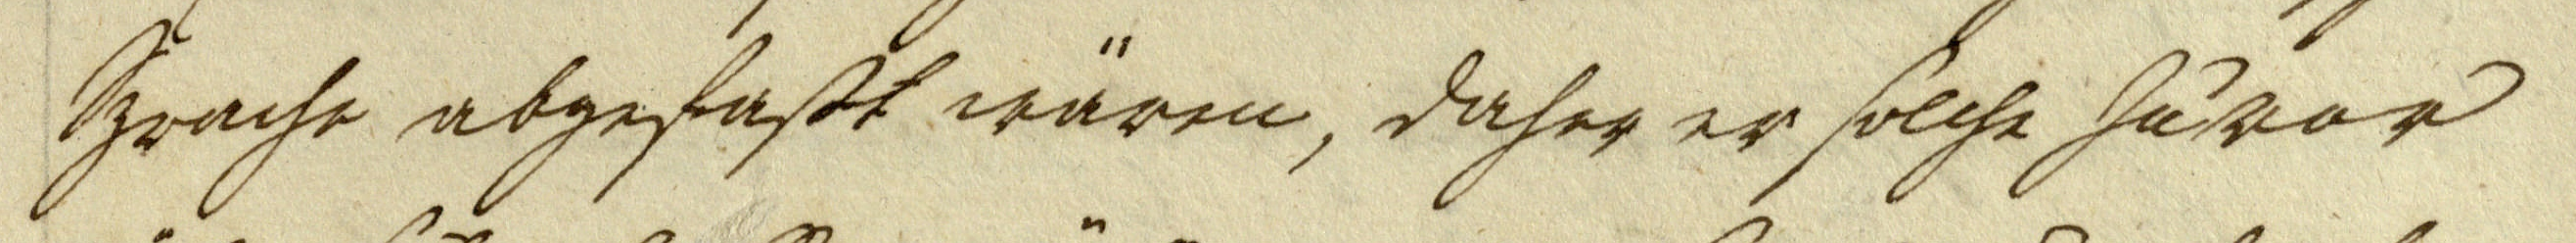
Sprache abgefaßt wären, daher er solche zuvor
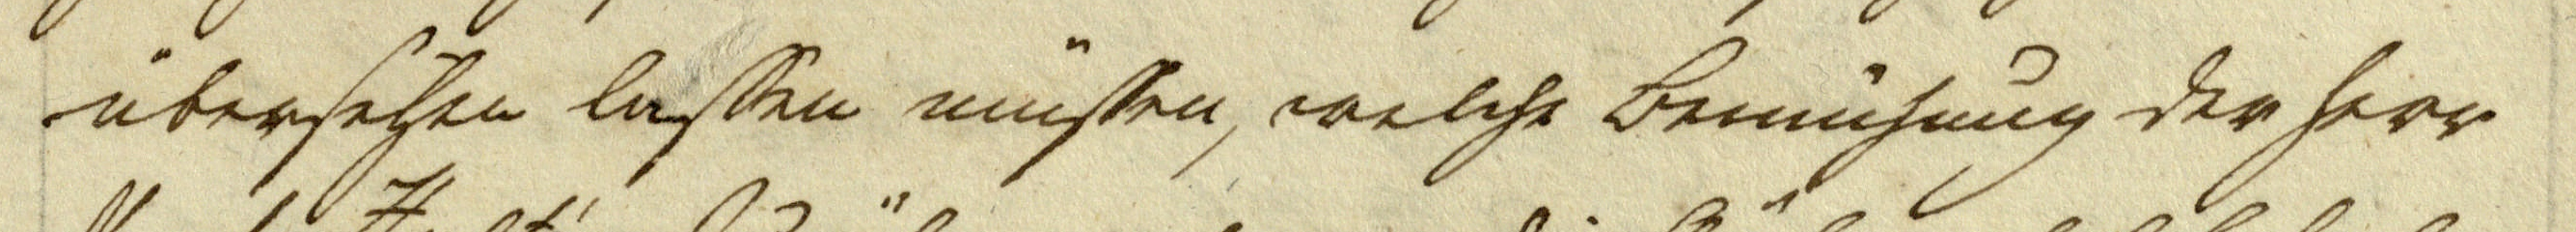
übersetzen lassen müssen, welche Bemühung der Herr
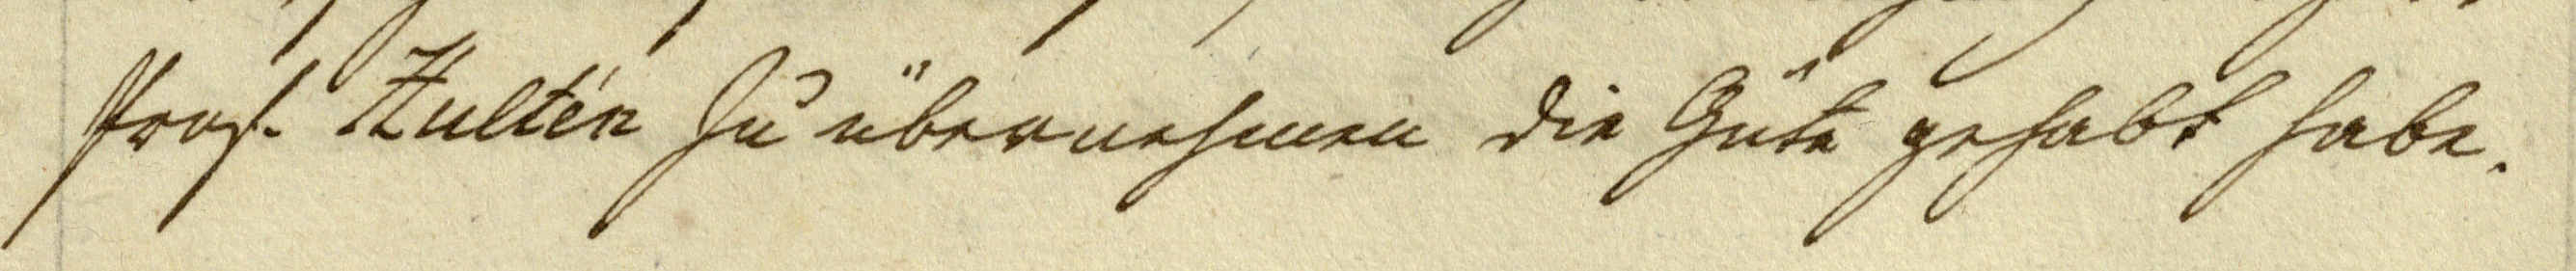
Prof. Hultén zu übernehmen die Güte gehabt habe.
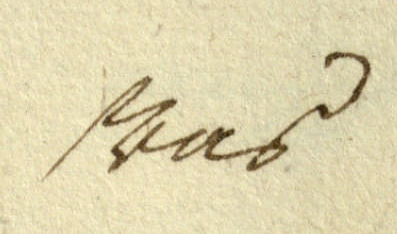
was
